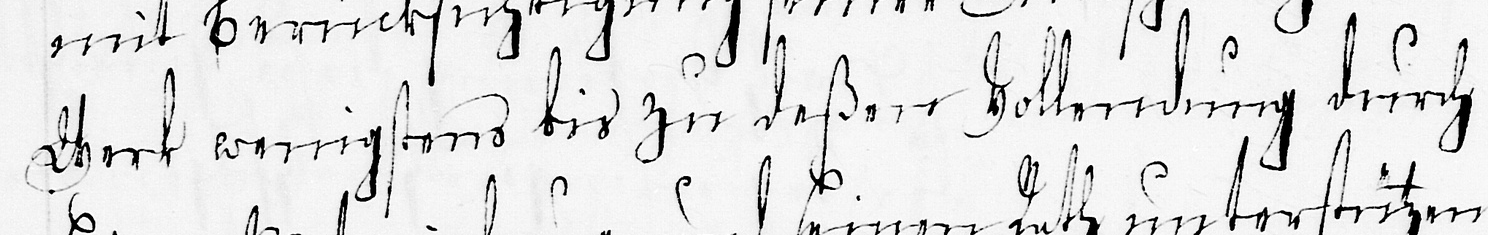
Werk wenigstens bis zu deßen Vollendung durch
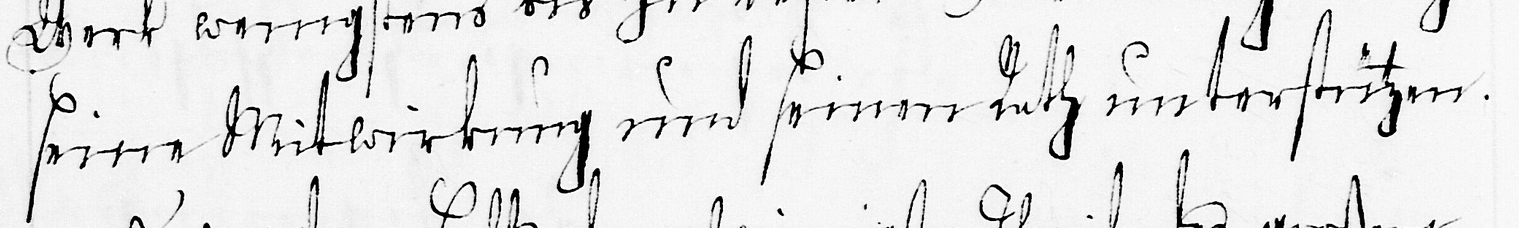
seine Mitwirkung und seinen Rath unterstützen.
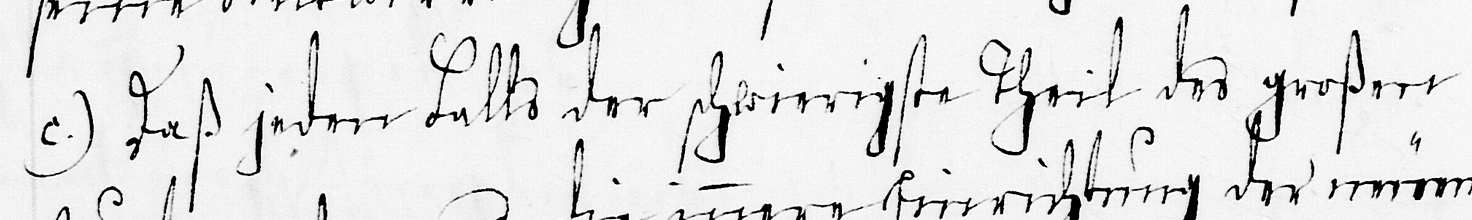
c.) Daß jeden Falls der schwierigste Theil des großen
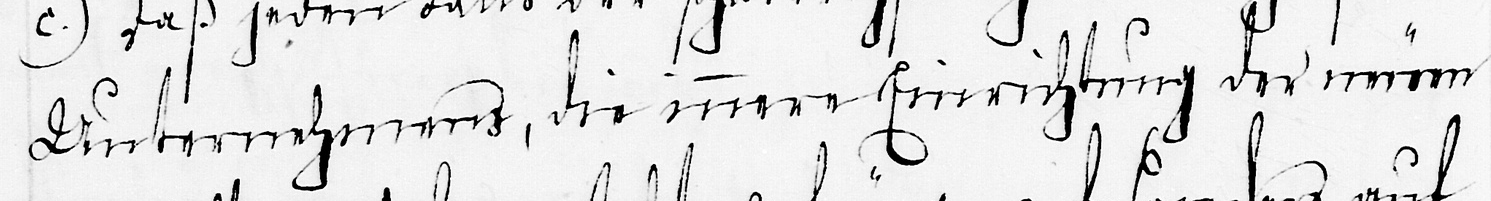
Unternehmens, die innere Einrichtung der neuen
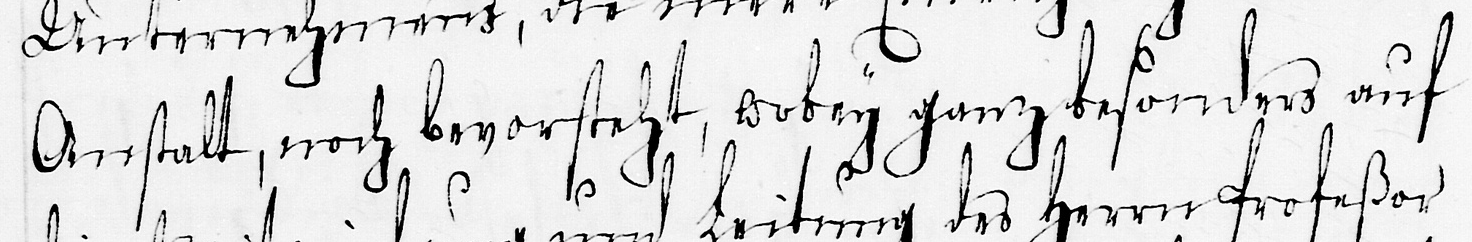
Anstalt, noch bevorsteht, wobey ganz besonders auf
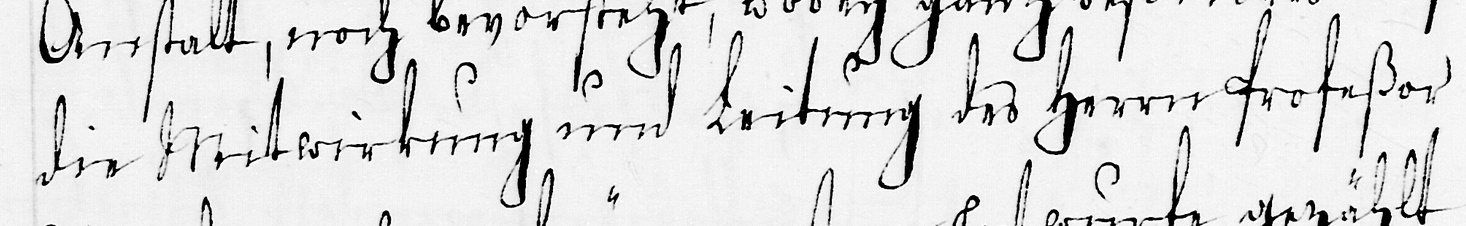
die Mitwirkung und Leitung des Herrn Profeßor
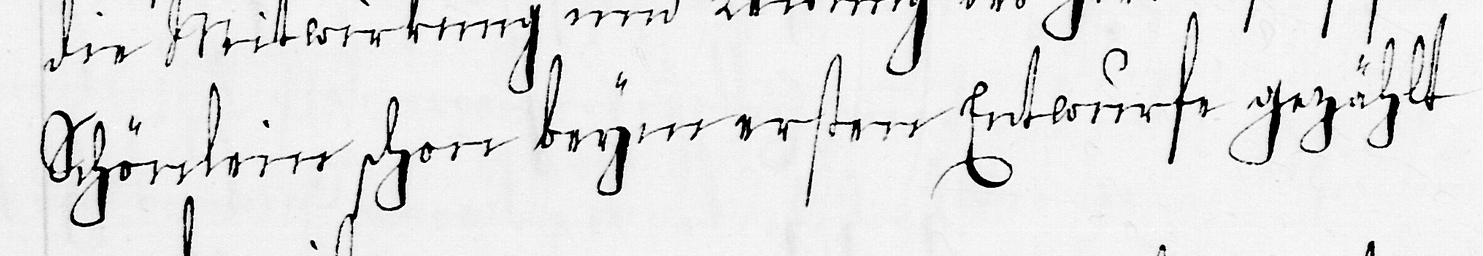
Schönlein schon beym ersten Entwurfe gezählt
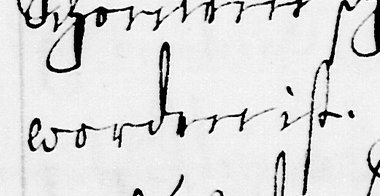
worden ist.
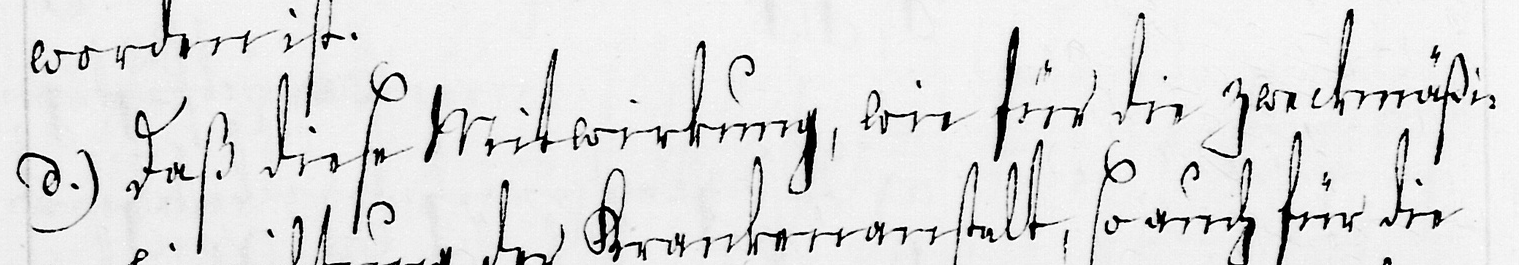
d.) Daß diese Mitwirkung, wie für die zweckmäßi¬
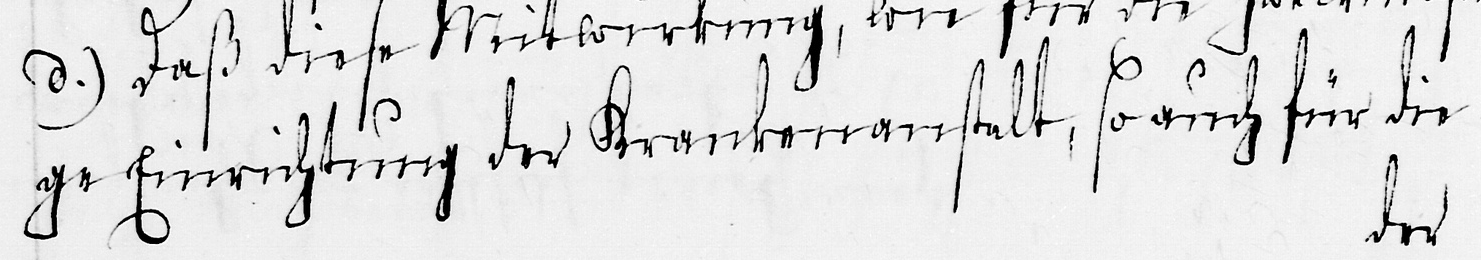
ge Einrichtung der Krankenanstalt, so auch für die
